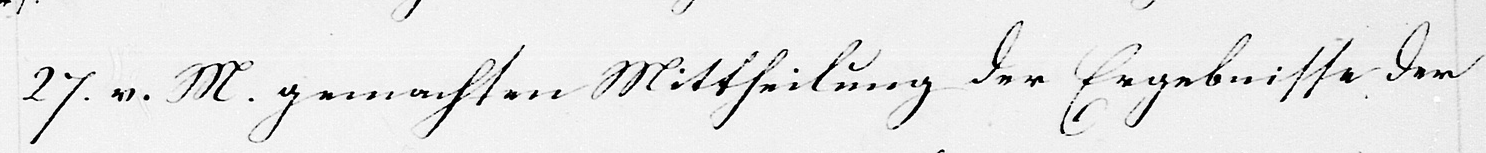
27. v. M. gemachten Mittheilung der Ergebnisse der
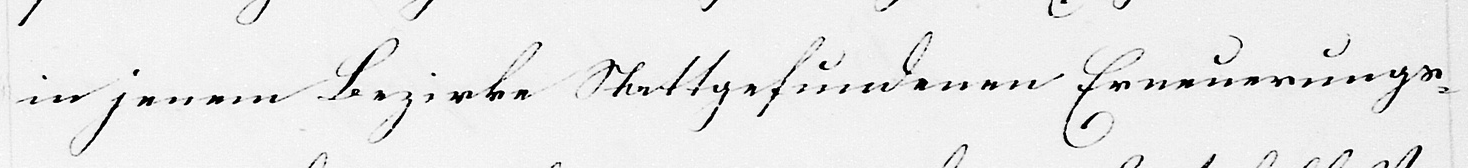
in jenem Bezirke Stattgefundenen Erneuerungs¬
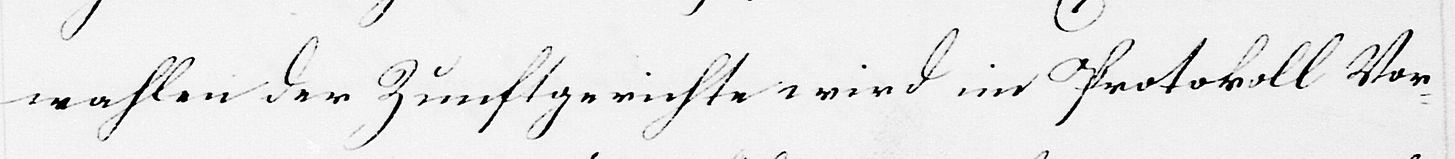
wahlen der Zunftgerichte wird im Protokoll Vor¬
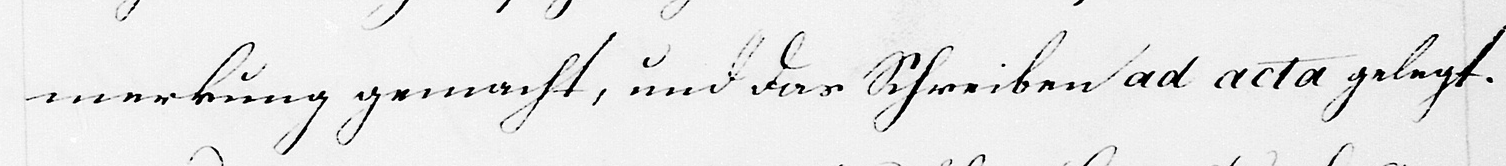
merkung gemacht, und das Schreiben ad acta gelegt.
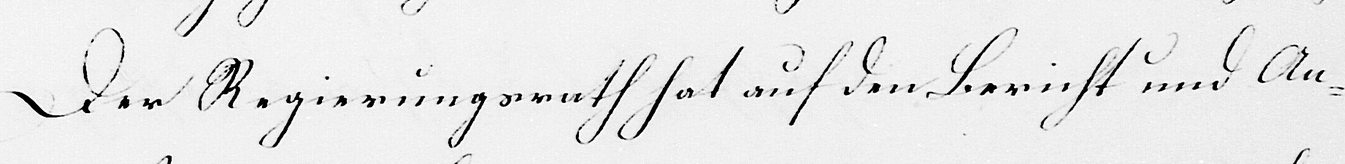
Der Regierungsrath hat auf den Bericht und An¬
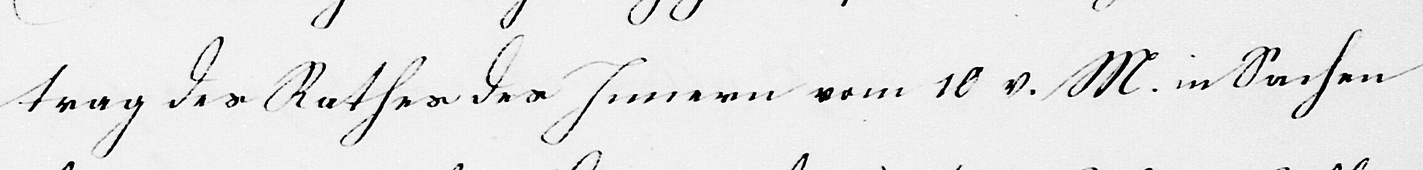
trag des Rathes des Innern vom 10 v. M. in Sachen
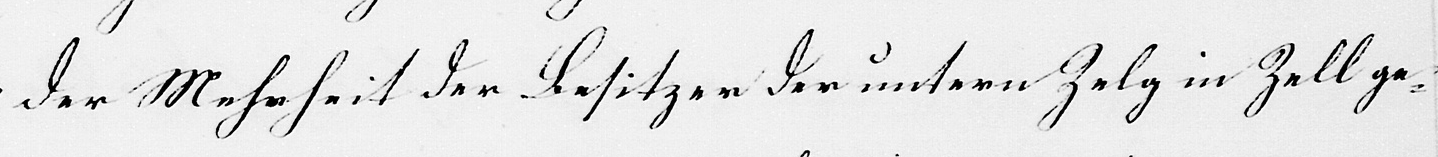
der Mehrheit der Besitzer der untern Zelg in Zell ge¬
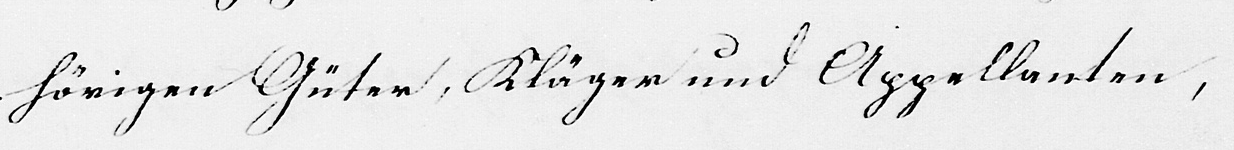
hörigen Güter, Kläger und Appellanten,
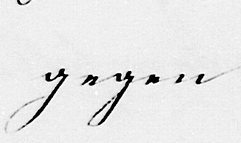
gegen
